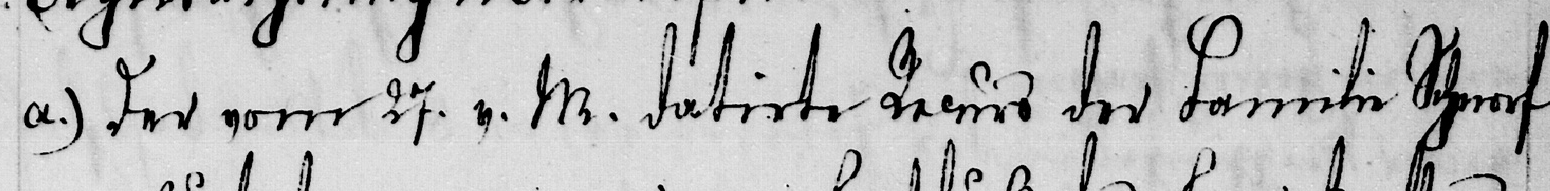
a.) Der vom 27. v. M. datirte Recurs der Familie Schnorf
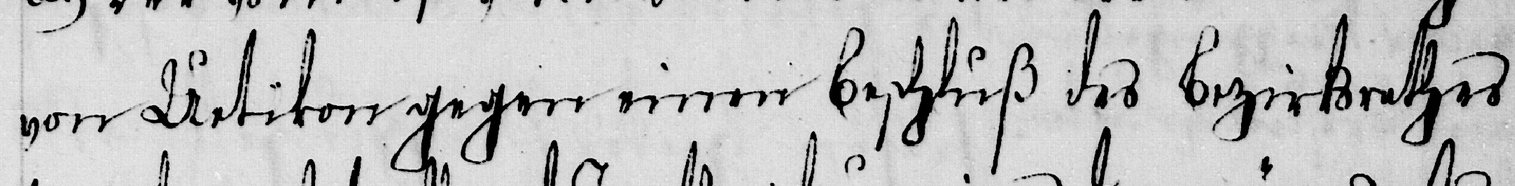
von Uetikon gegen einen Beschluß des Bezirksrathes
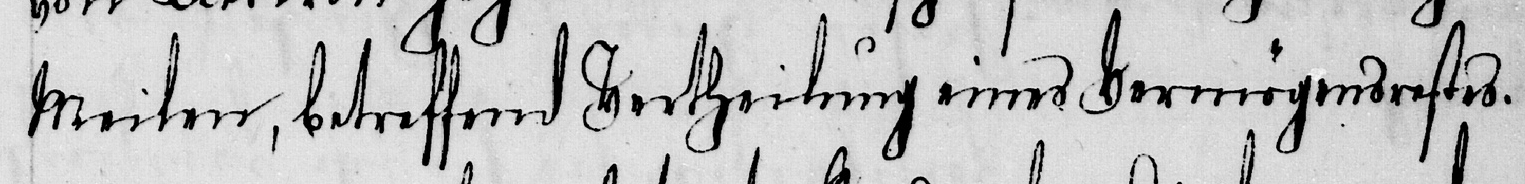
Meilen, betreffend Vertheilung eines Vermögensrestes.
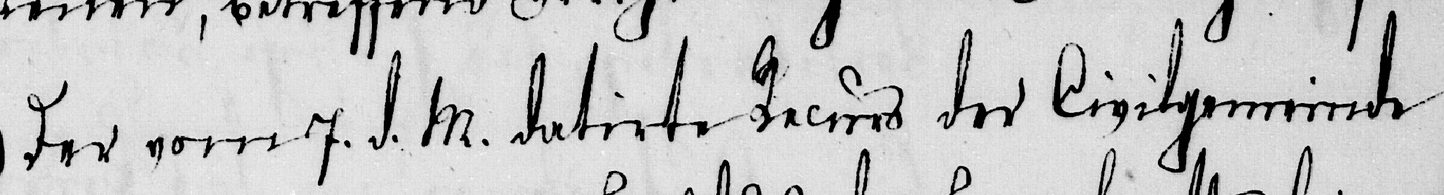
Der vom 7. d. M. datirte Recurs der Civilgemeinde
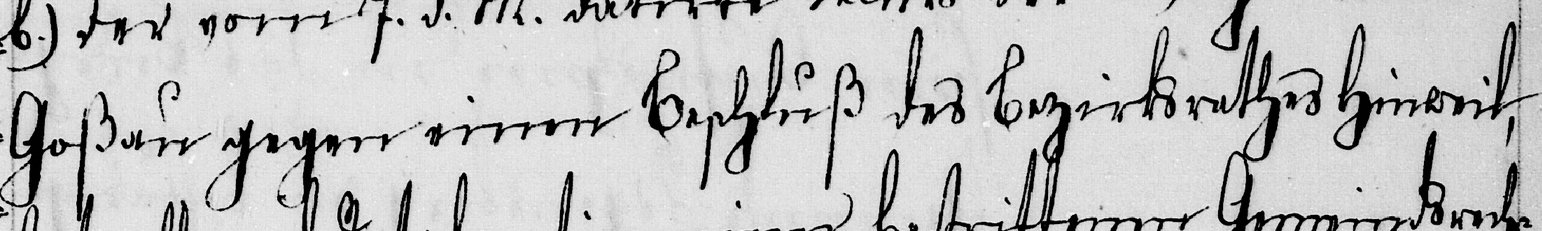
Goßau gegen einen Beschluß des Bezirksrathes Hinweil,
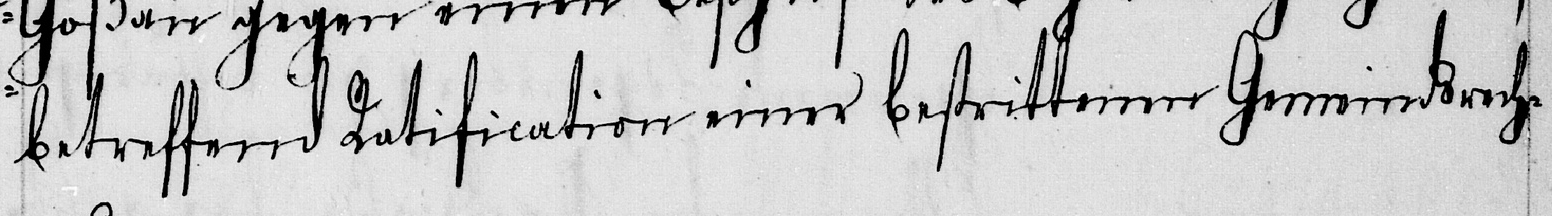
betreffend Ratification einer bestrittenen Gemeindsrech¬
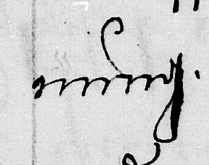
nung.
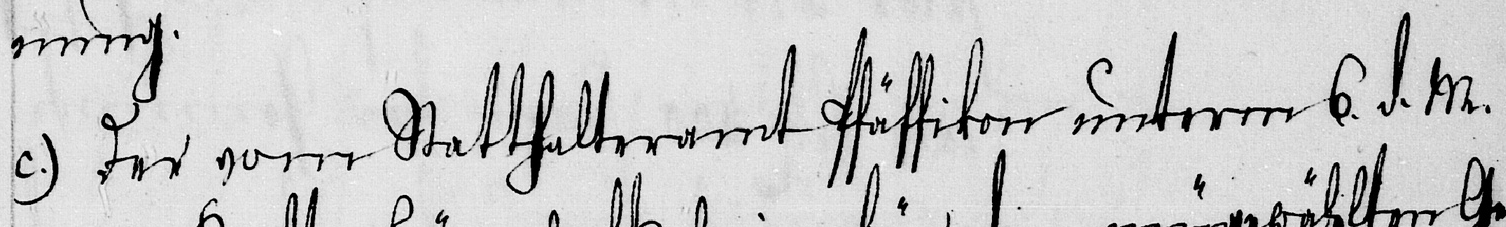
c.) Der vom Statthalteramt Pfäffikon unterm 6. d. M.
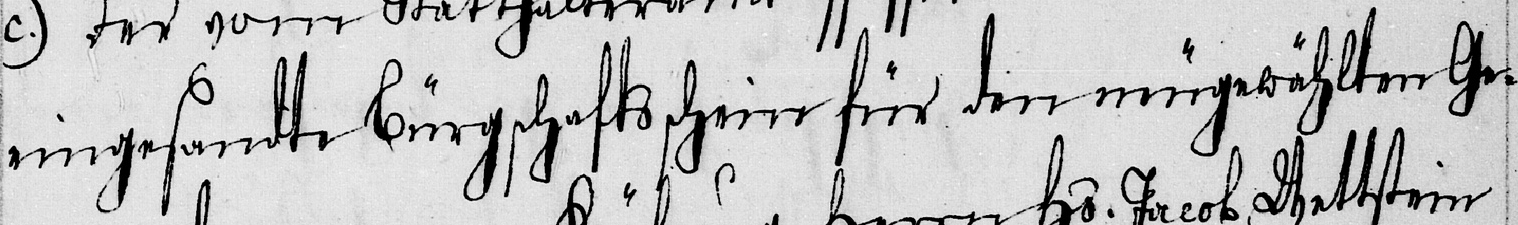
eingesandte Bürgschaftsschein für den neugewählten Ge¬
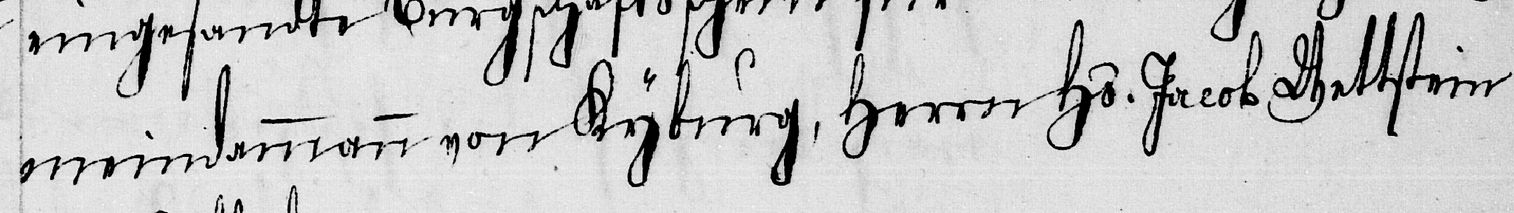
meindeammann von Kyburg, Herren Hs. Jacob Wettstein
